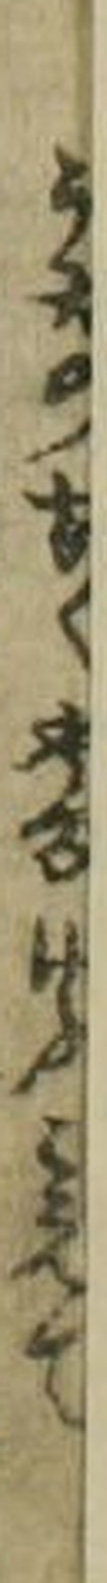うゐのおくやまけふこえて
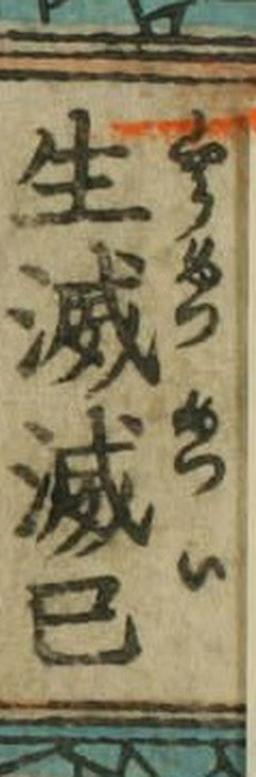生滅滅已
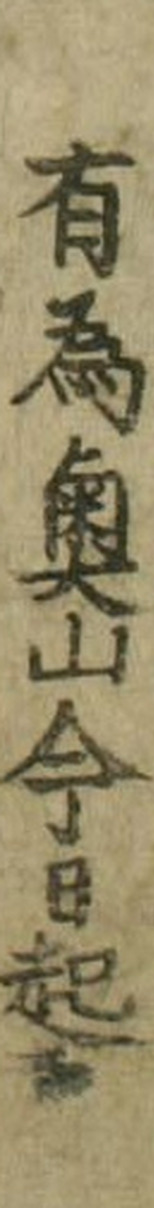有為奥山今日越
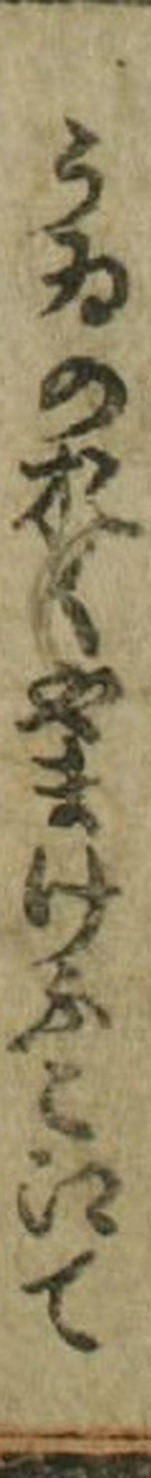うゐのおくやまけふこえて
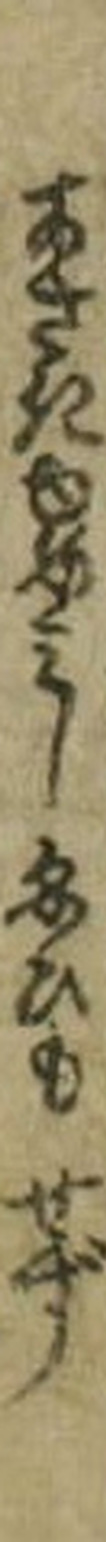あさきゆめみしゑひもせず
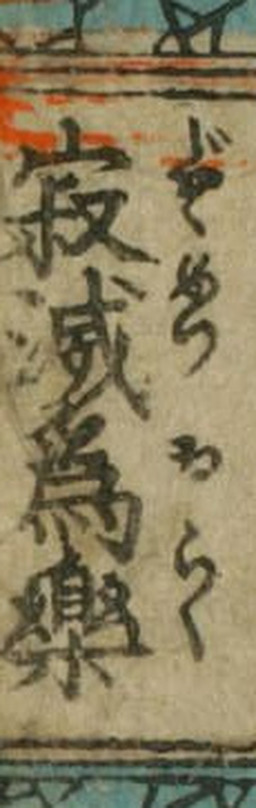寂滅為楽
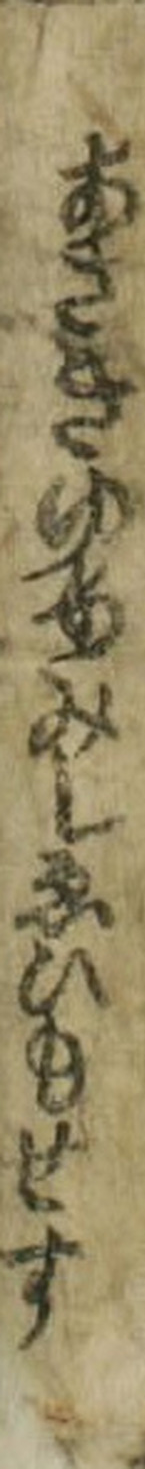あさきゆめみしゑひもせず
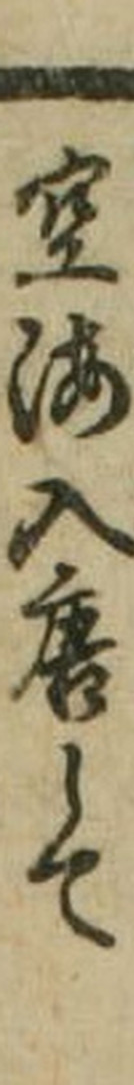空海入唐して
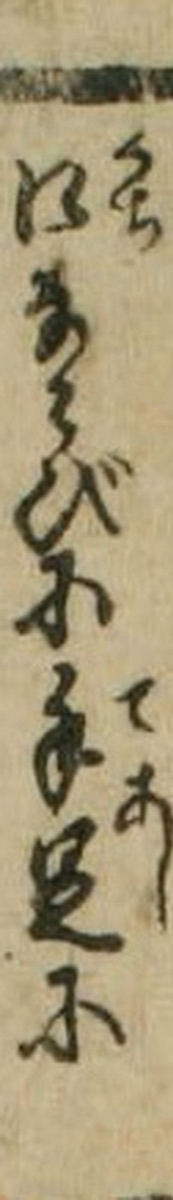口ならびに手足に
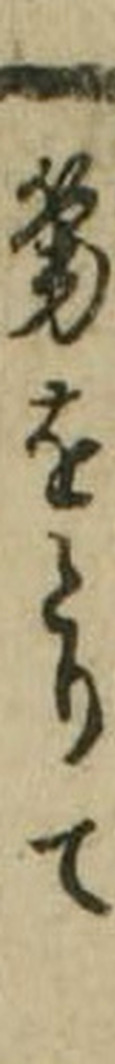筆をとりて
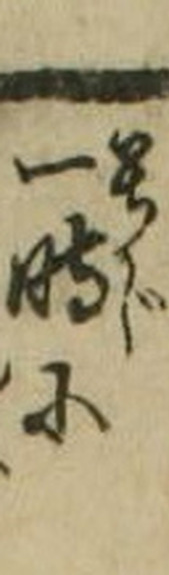一時に
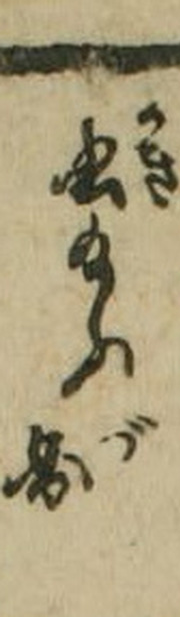書給ふ図
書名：七ツいろは並絵抄
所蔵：東京学芸大学教育コンテンツアーカイブ
